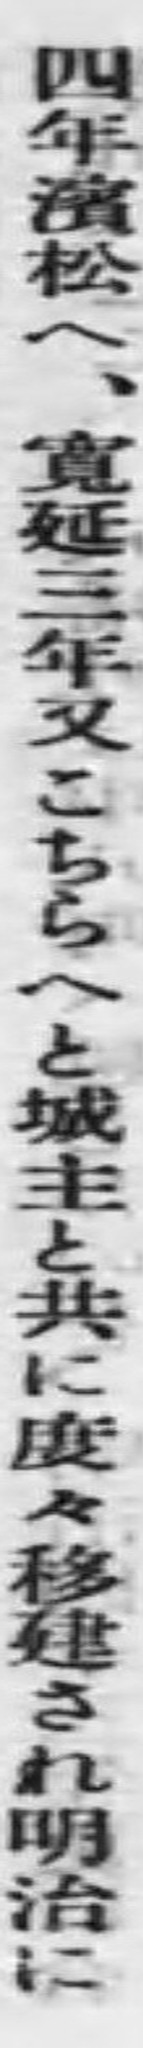四年浜松へ、寛延三年又こちらへと城主と共に度々移建され明治に
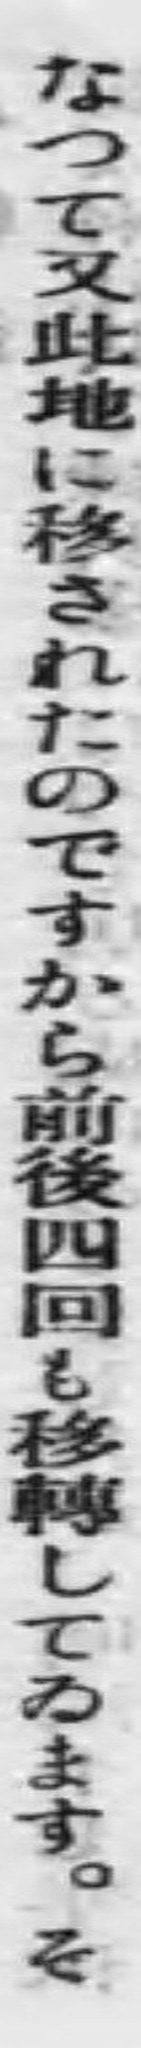なつて又此地に移されたのですから前後四回も移転してゐます。そ
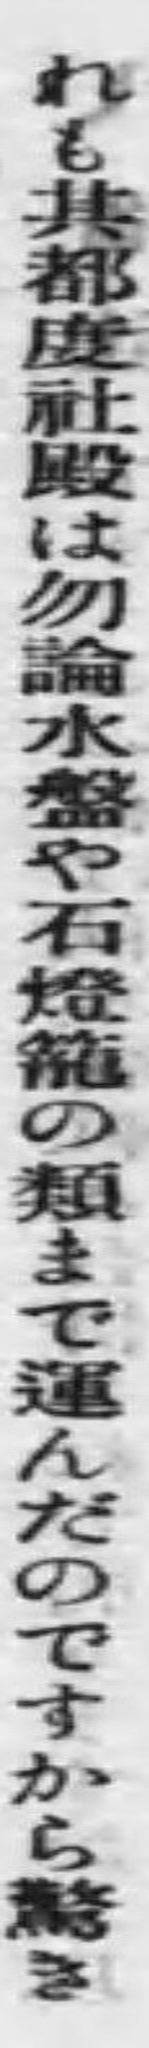れも其都度社殿は勿論水盤や石灯籠の類まで運んだのですから驚き
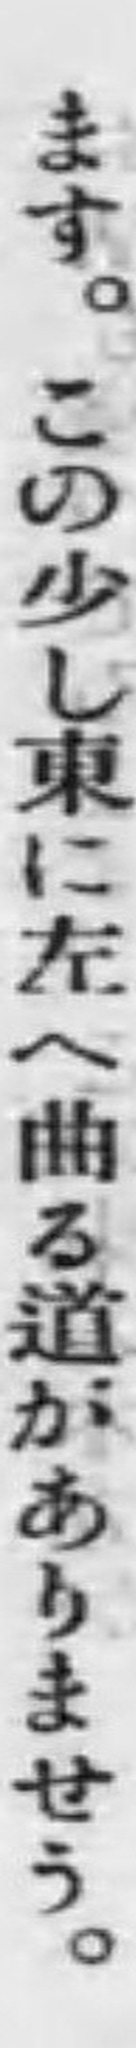ます。この少し東に左へ曲る道がありませう。
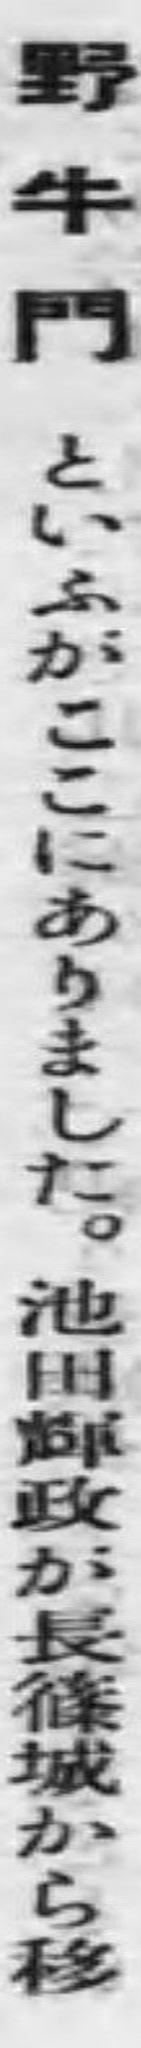野牛門といふがここにありました。池田輝政が長篠城から移
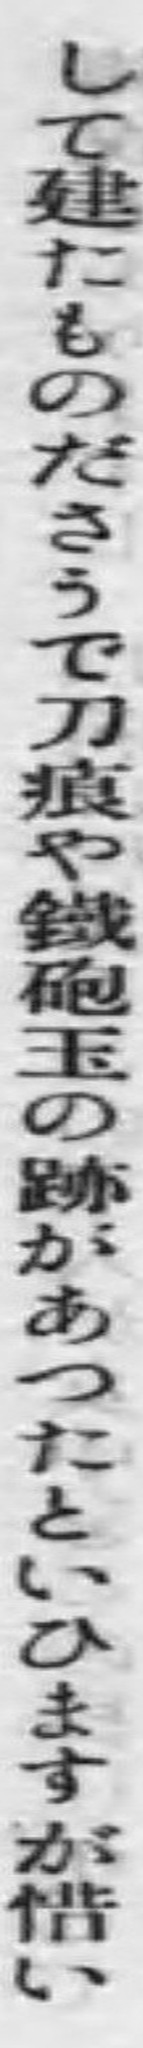して建たものださうで刀痕や鉄砲玉の跡があつたといひますが惜い
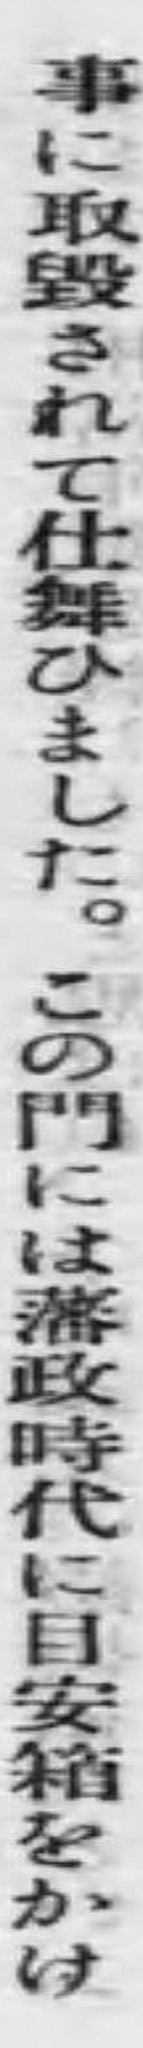事に取毀されて仕舞ひました。この門には藩政時代に目安箱をかけ
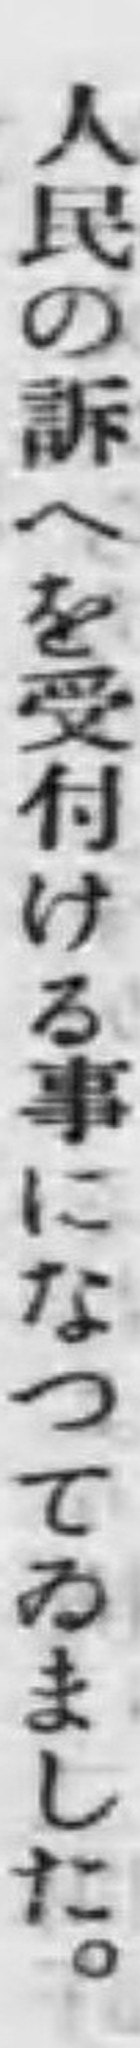人民の訴へを受付ける事になつてゐました。
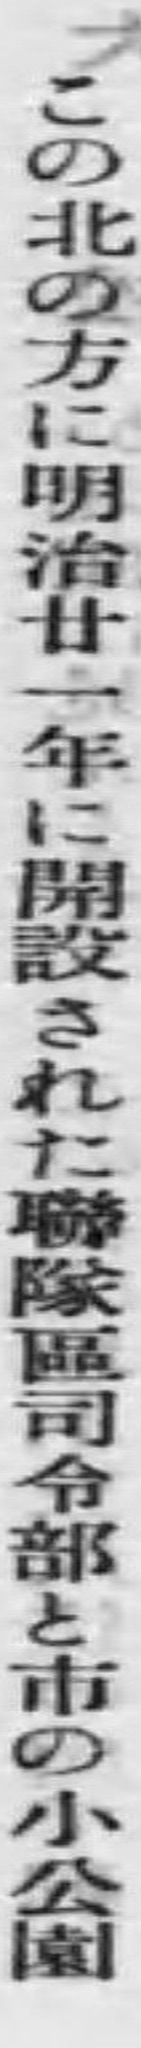この北の方に明治廿一年に開設された聯隊区司令部と市の小公園
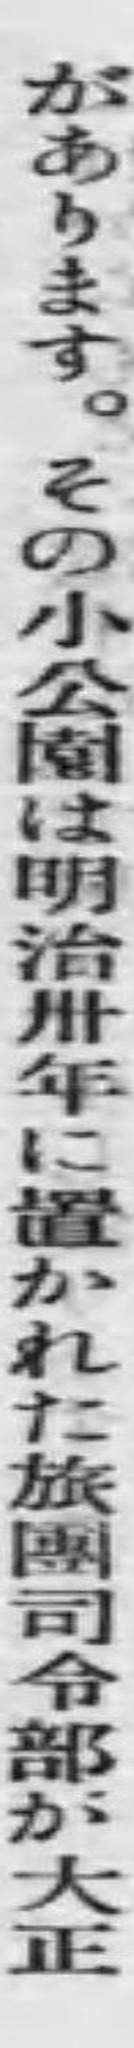があります。その小公園は明治卅年に置かれた旅団司令部が大正
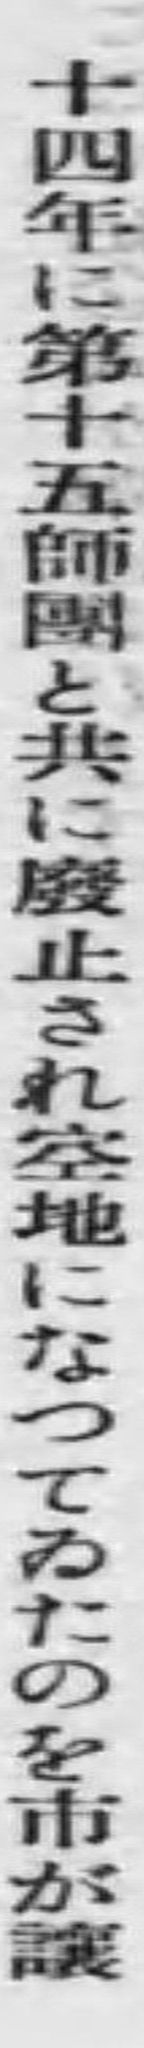十四年に第十五師団と共に廃止され空地になつてゐたのを市が譲
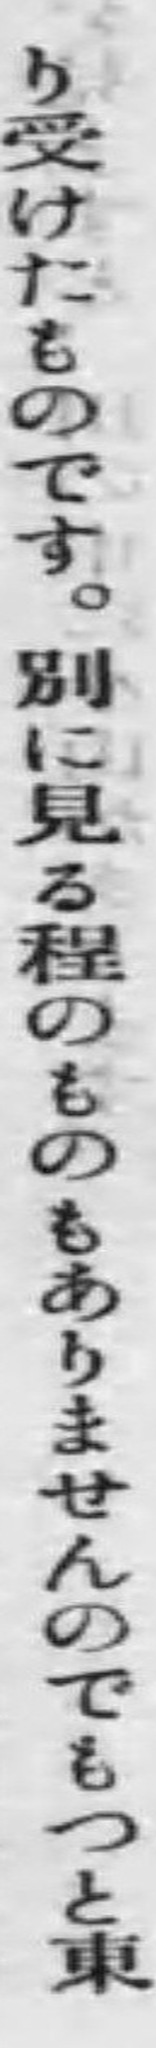り受けたものです。別に見る程のものもありませんのでもつと東
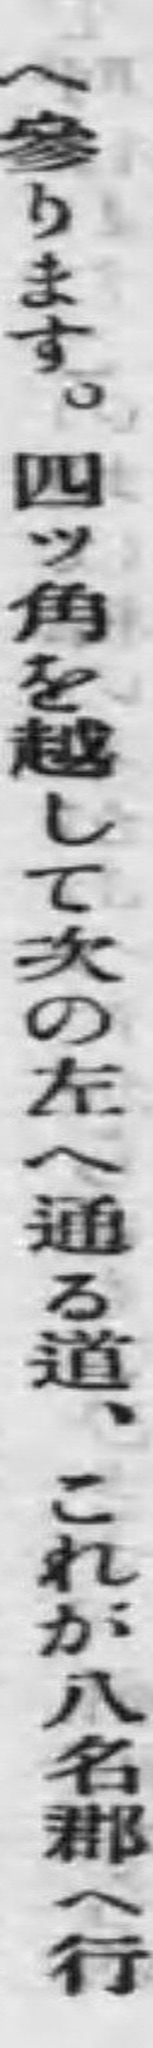へ参ります。四ッ角を越して次の左へ通る道、これが八名郡へ行
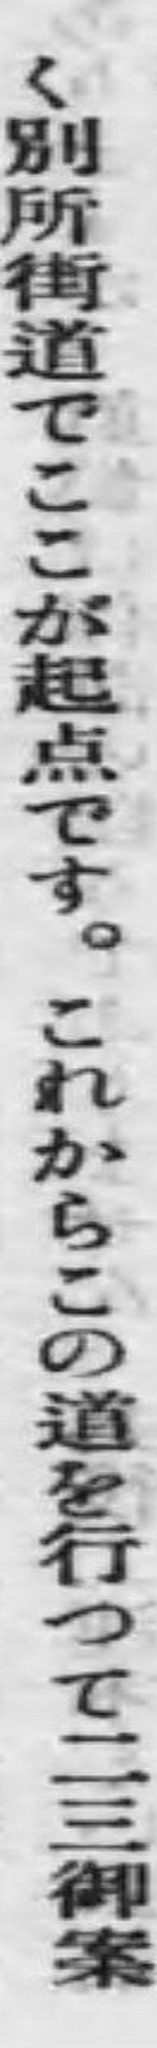く別所街道でここが起点です。これからこの道を行つて二三御案
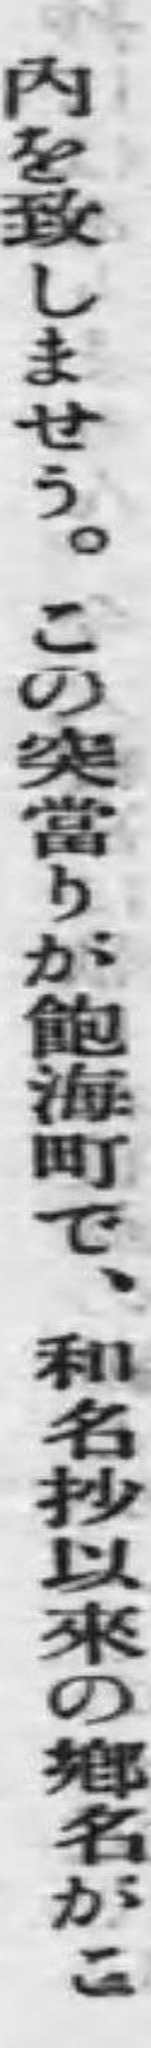内を致しませう。この突当りが飽海町で、和名抄以来の郷名がこ
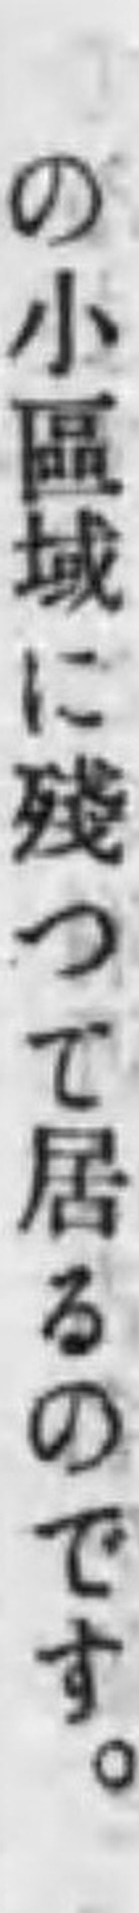の小区域に残つて居るのです。
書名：東三河道中記 : 豊橋市及其附近案内
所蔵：国立国会図書館 National Diet Library, JAPAN
